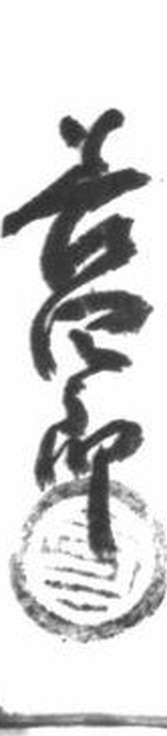善四郎
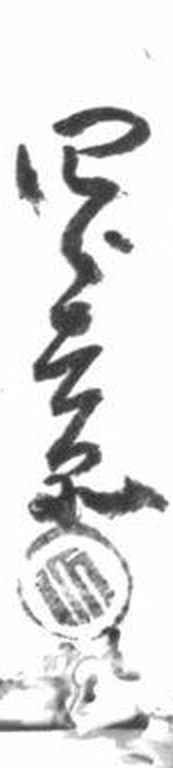四郎兵衛
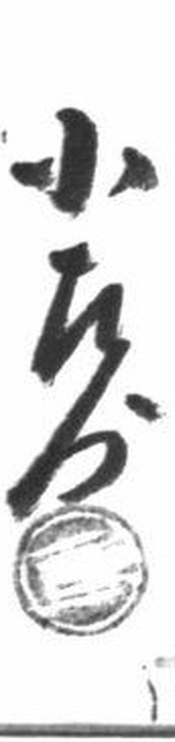小左衛門
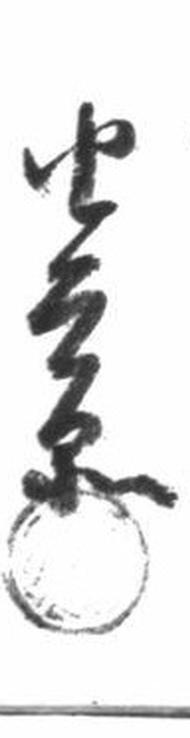由兵衛
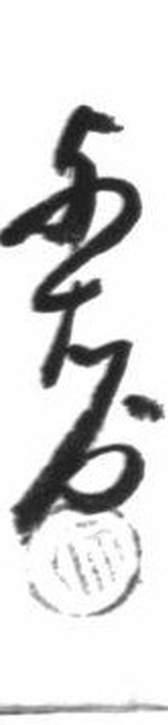与右衛門
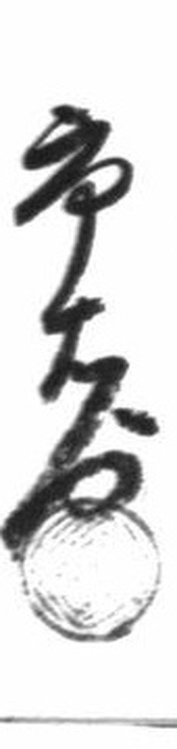市右衛門
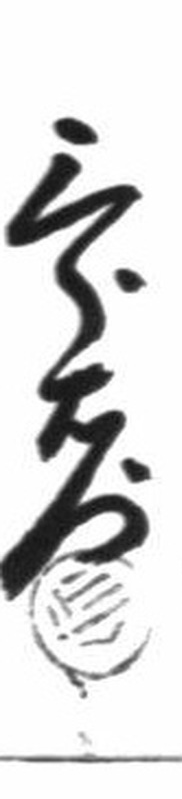三郎右衛門
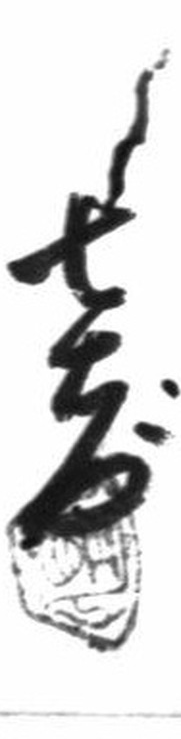七右衛門

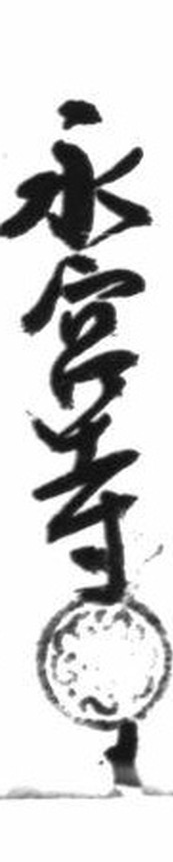永宮寺
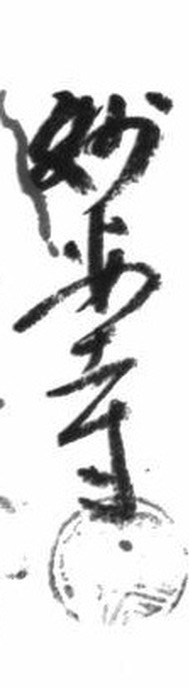妙安寺
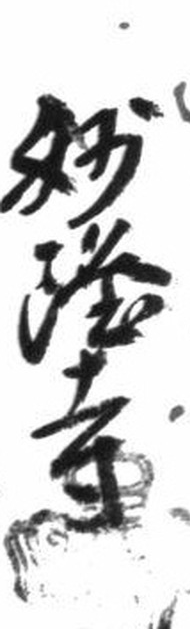妙安寺
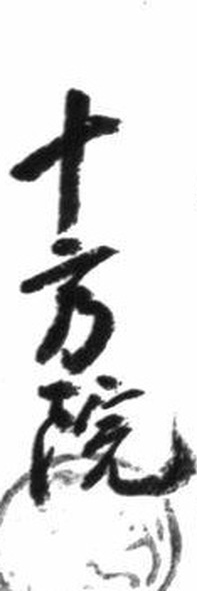十方院
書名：宝永弐酉五月火之用心護摩之灰御改帳証文
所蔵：福井県文書館 Fukui Prefectural Archives
